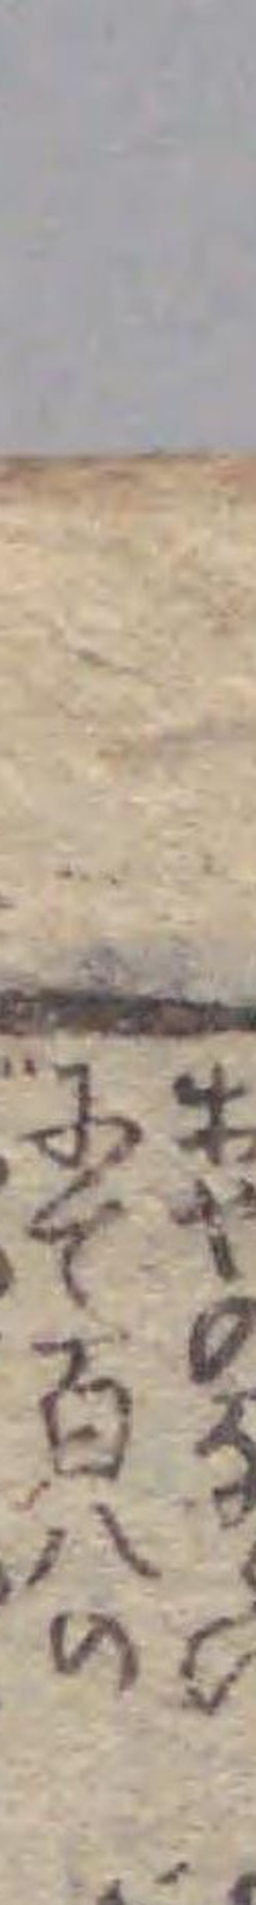にて百八の
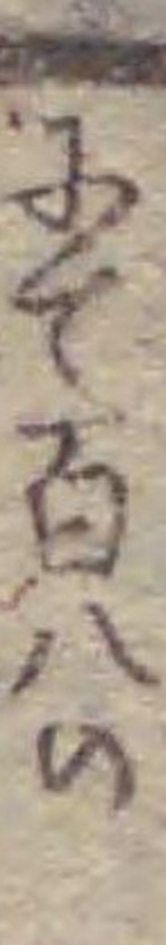にて百八の
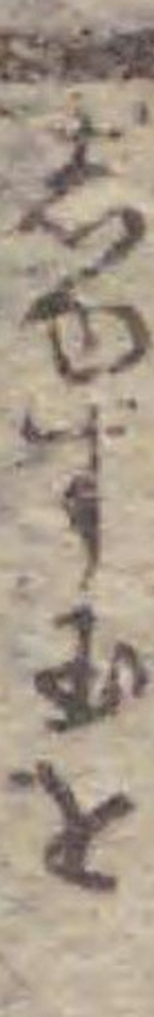じゆず玉を
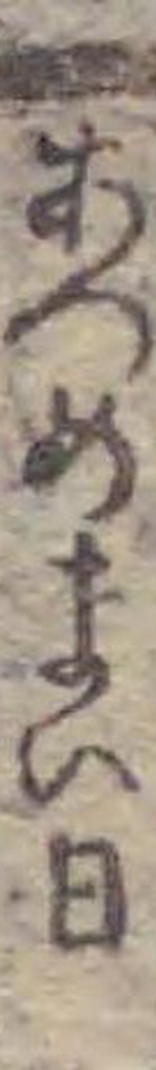あつめよい日
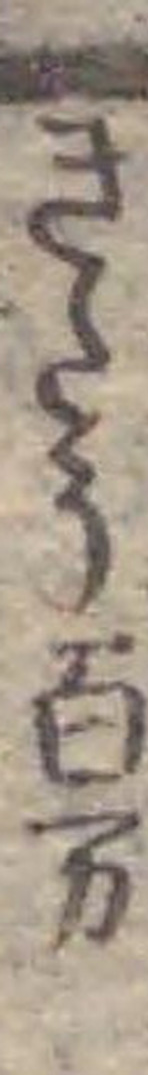きたう百万
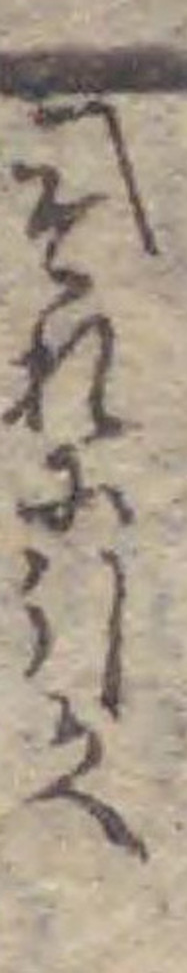〽それに引かへ
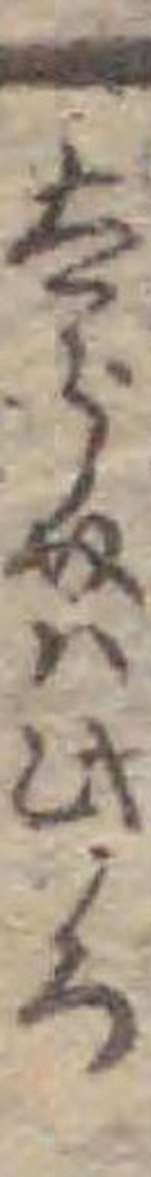太郎介は此ころ
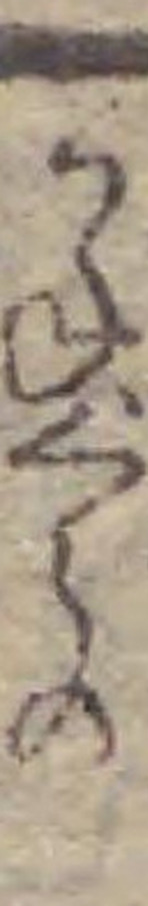かねぐらの
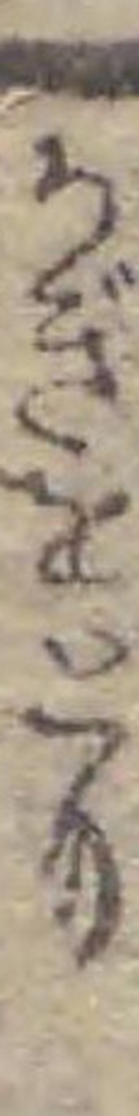かぎをとり
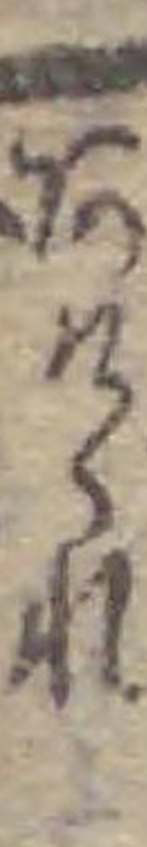あけられ
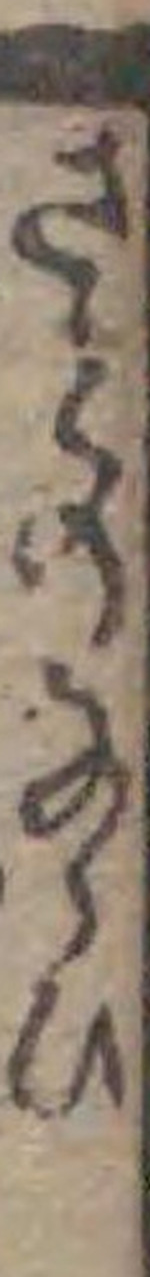さとのならひ
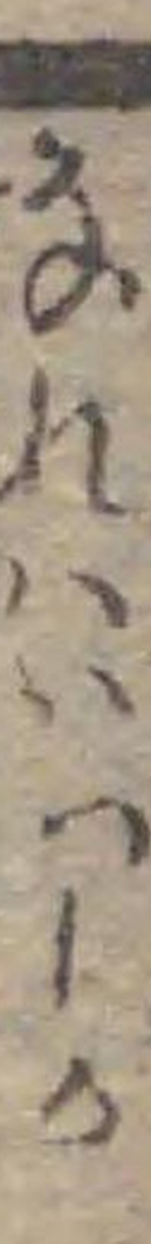なれはいつしか
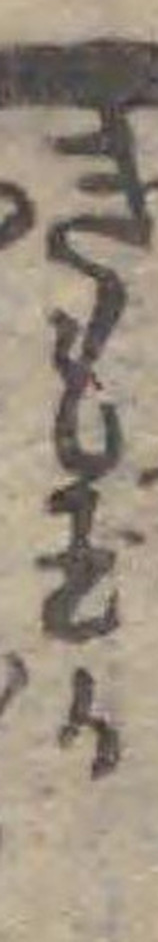きも玉か
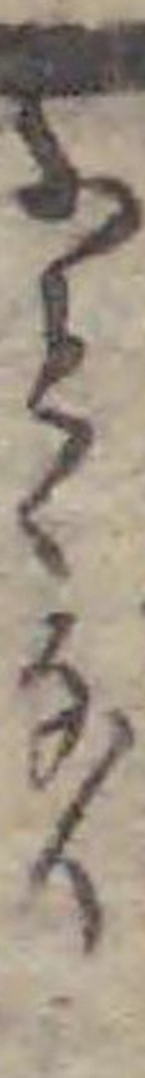ふとくなり
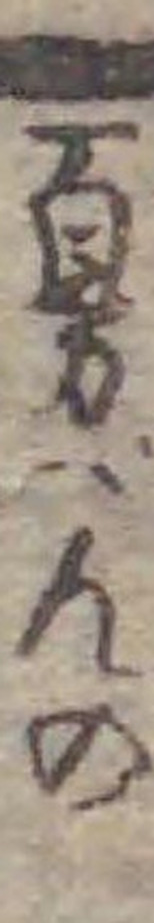百万べんの
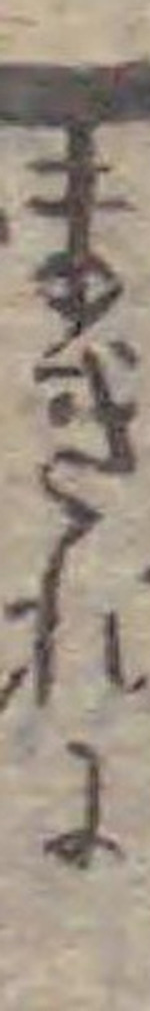まぎれに
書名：四遍搨心学草帋 : 3巻
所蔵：国立国会図書館 National Diet Library, JAPAN
